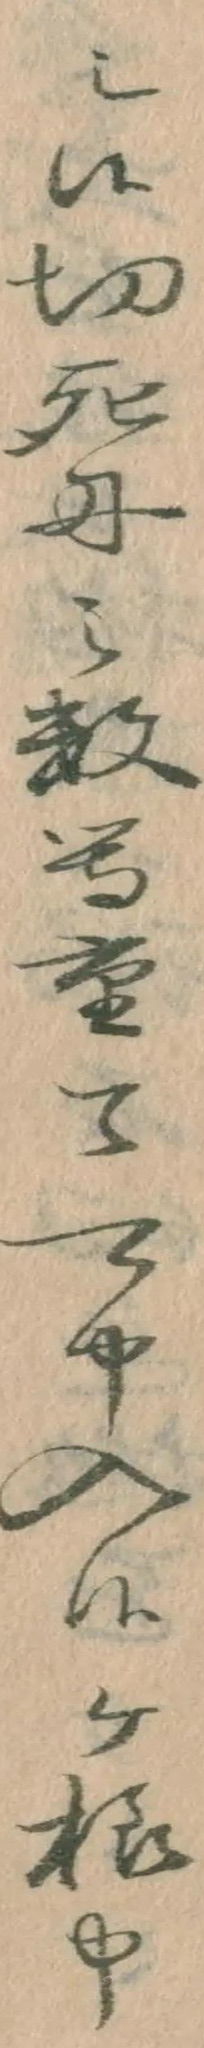し候切支丹之数等重て可申入候け様申
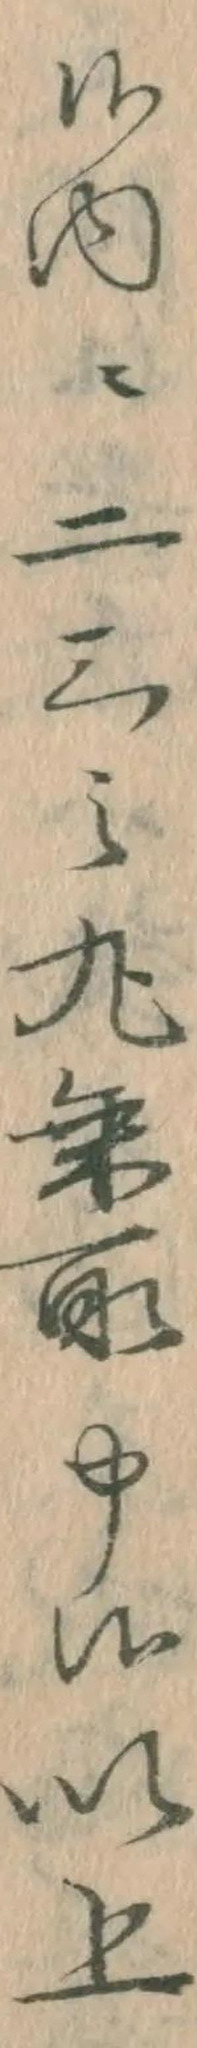候内に二三之丸乗取申候以上
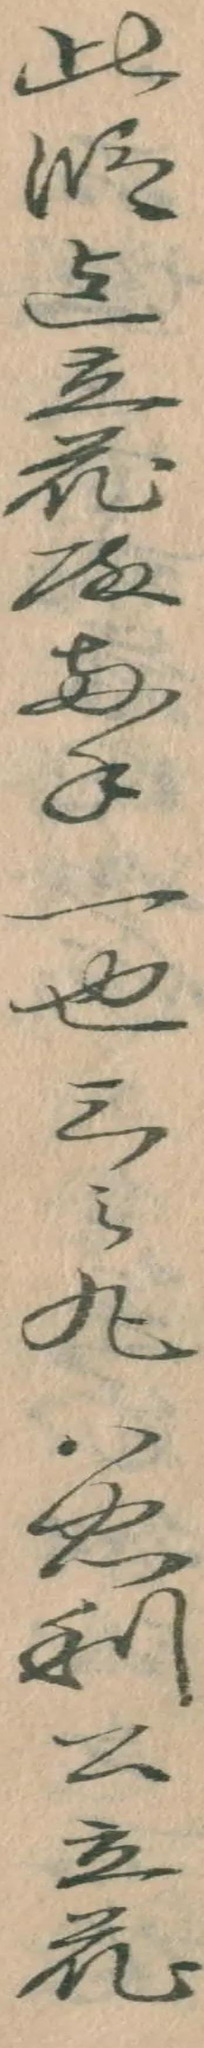此段迄立花殿両手一也三之丸は忠利公立花
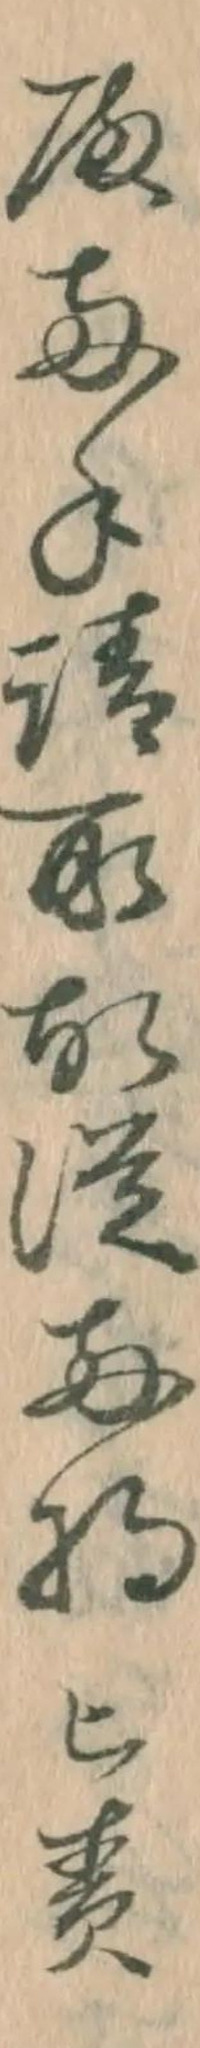殿両手請取故従両将被責
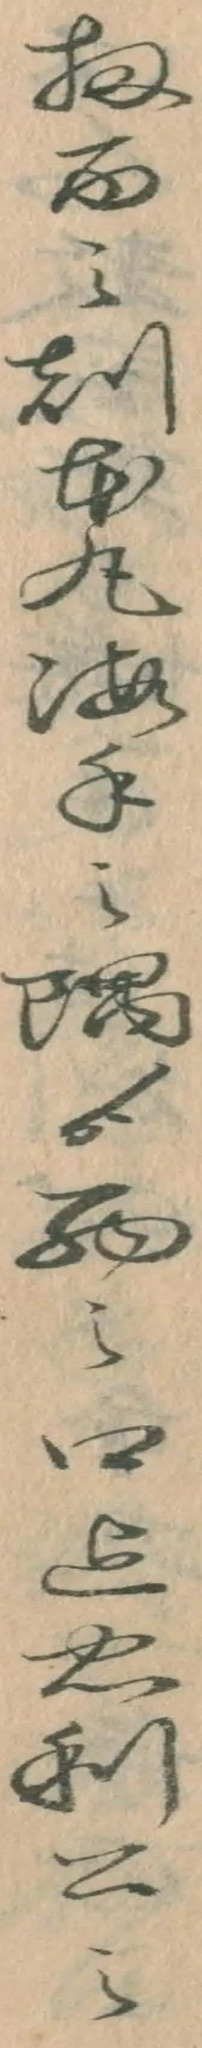扨酉之刻本丸海手之隅ゟ西之口迄忠利公之

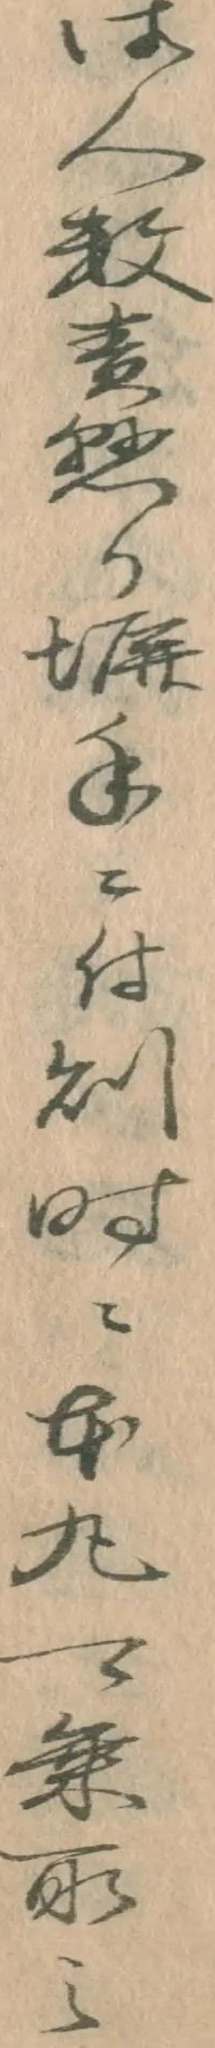御人数責懸り塀手に付則時に本丸可乗取之
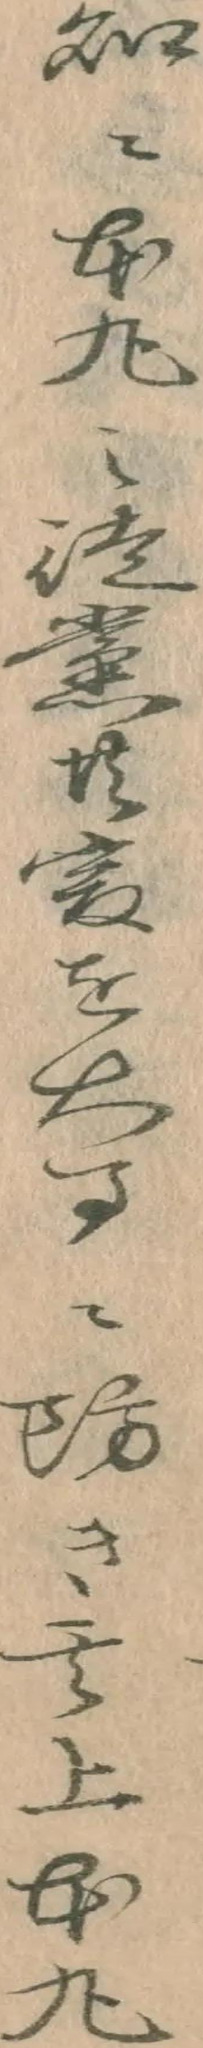処に本丸之徒党共爰を大事に防き基上本丸
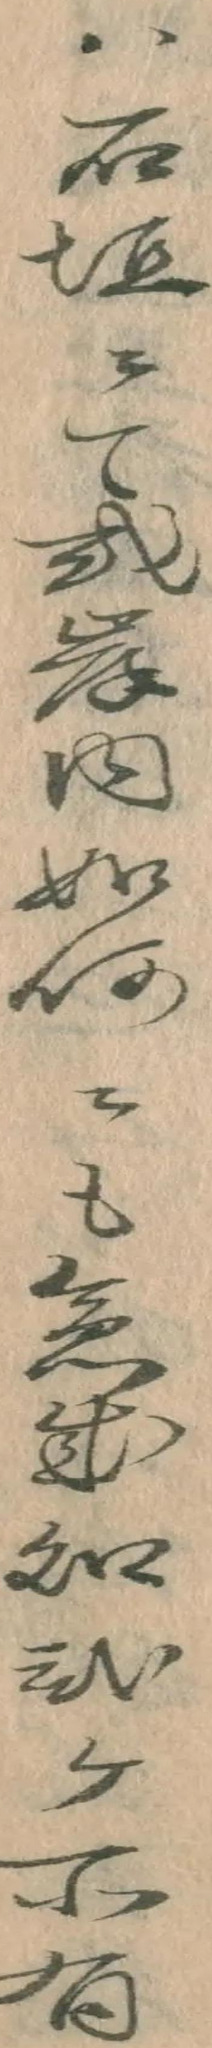は石垣にて或岸内如何にも急成処弐け所有
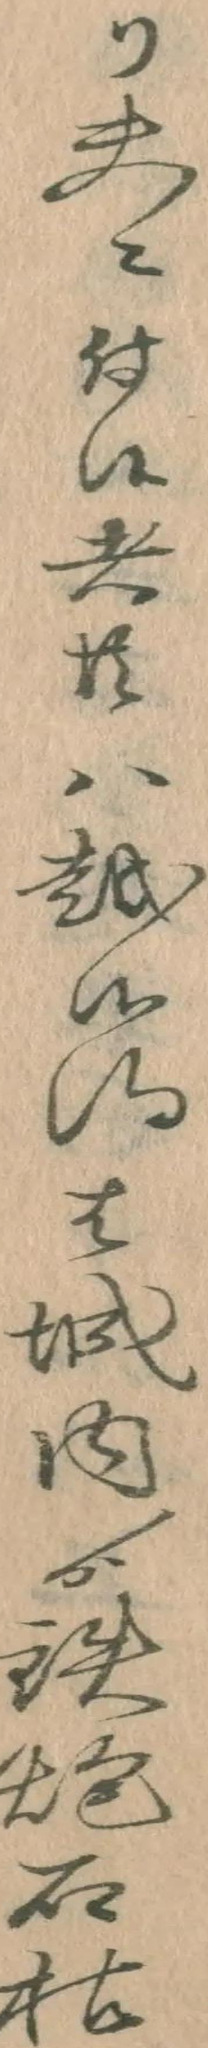り夫に付候者共は越候得者城内ゟ鉄砲石枯
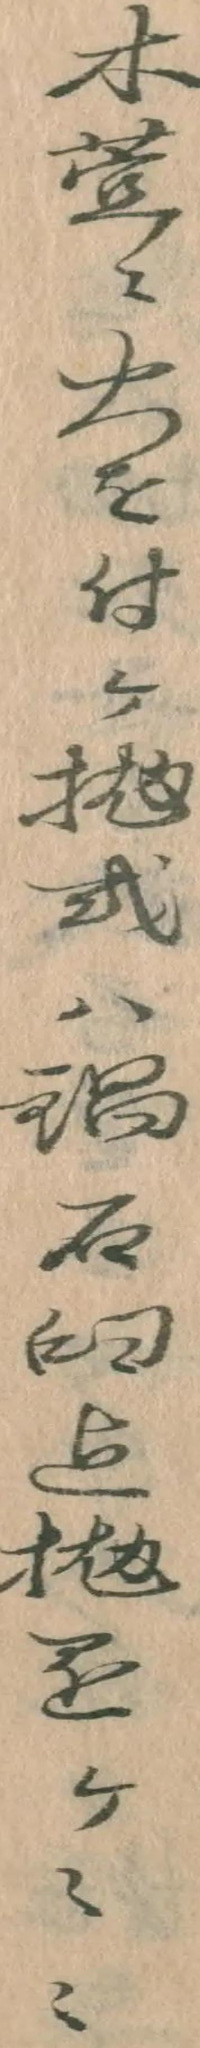木萱に火を付け抛或は鍋石臼迄抛懸け々々
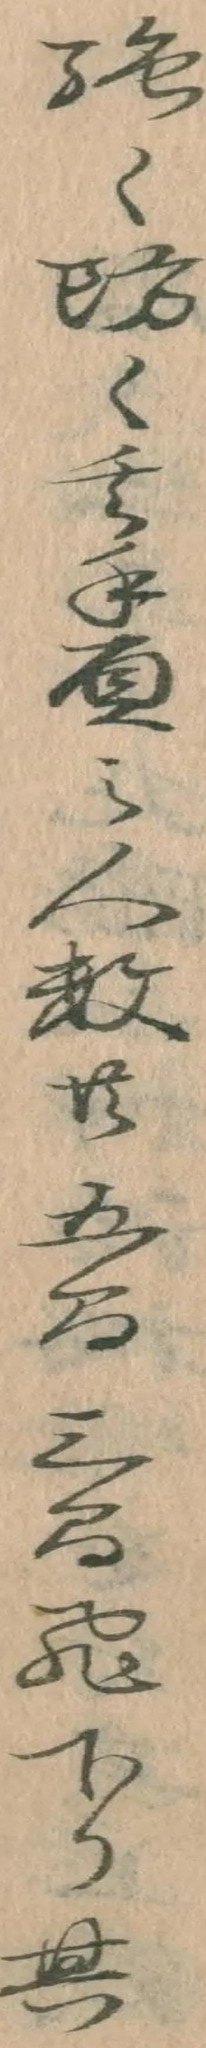強く防く其手負之人数共五間三間飛下り其
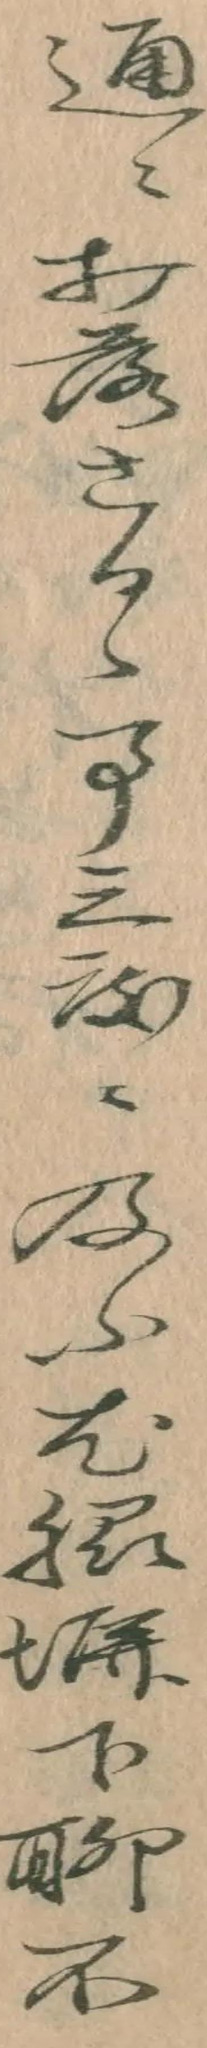通に打落さるゝ事三度に及ふ尤脇塀下聊不
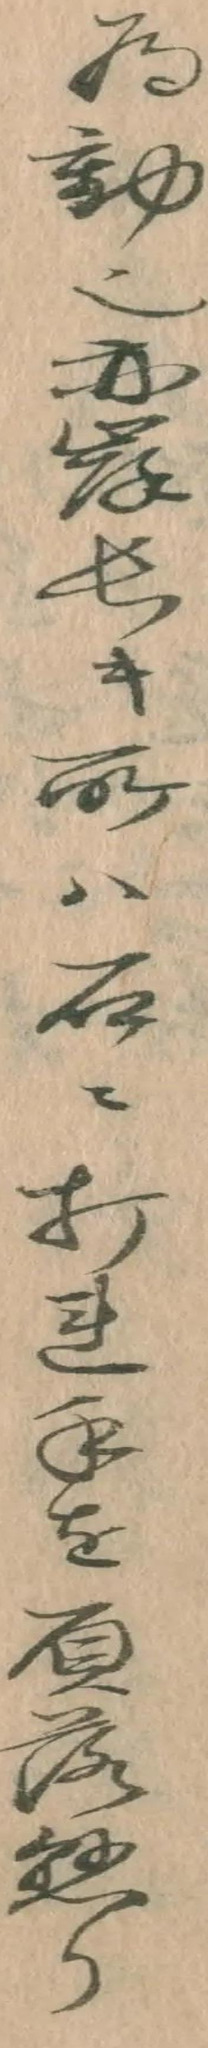為勤也亦岸長き所は石に打連手を負落懸り
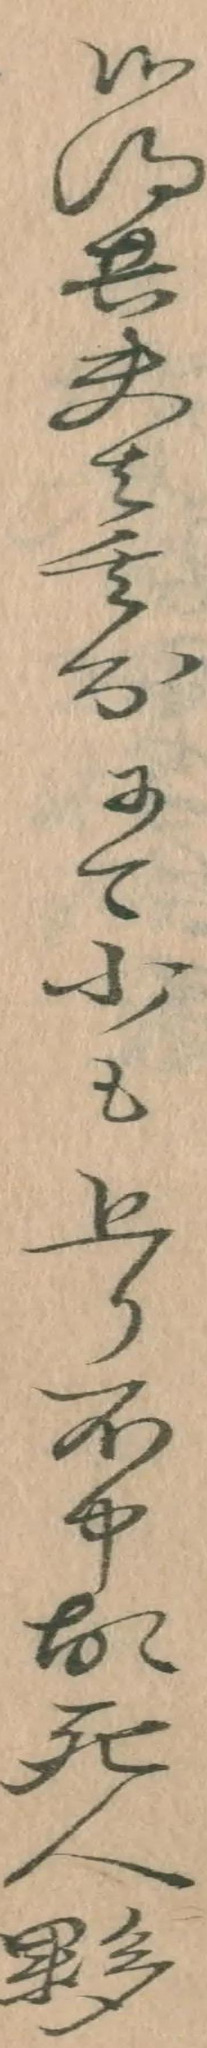候得共夫者其分尓て少も上り不申故死人夥
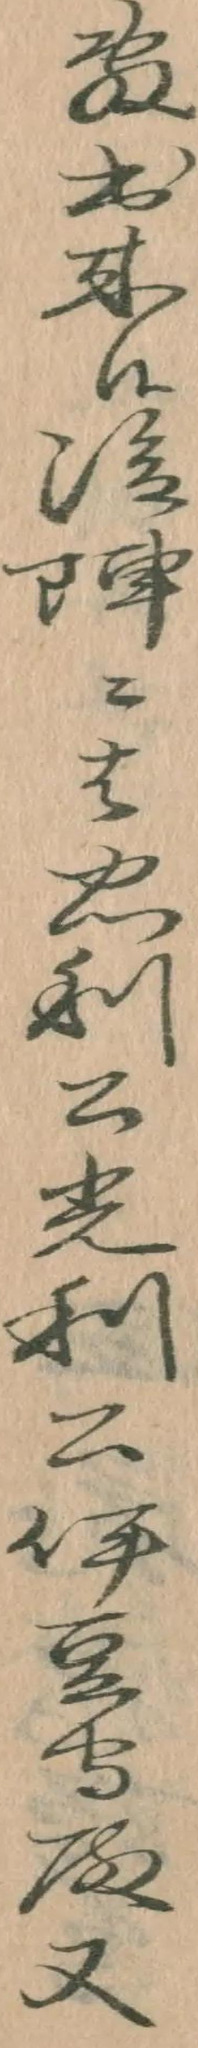敷出来候後陣に者忠利公光利公伊豆守殿又
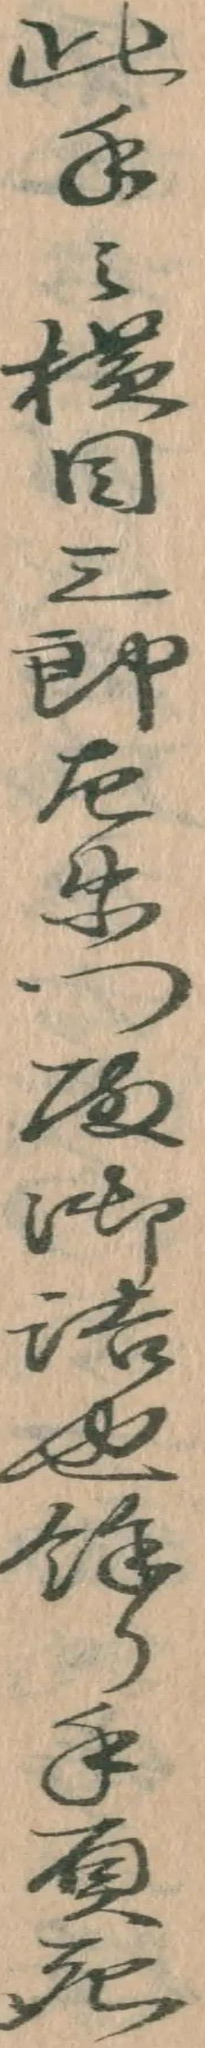此手之横目三郎左衛門殿御詰也余り手負死
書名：切支丹御退治記 49巻. [8]
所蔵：国立国会図書館 National Diet Library, JAPAN
